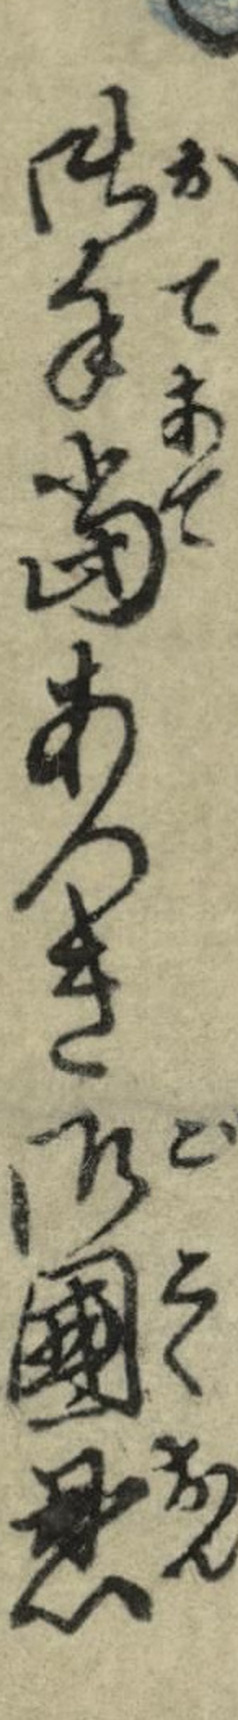御手当あつき御国恩
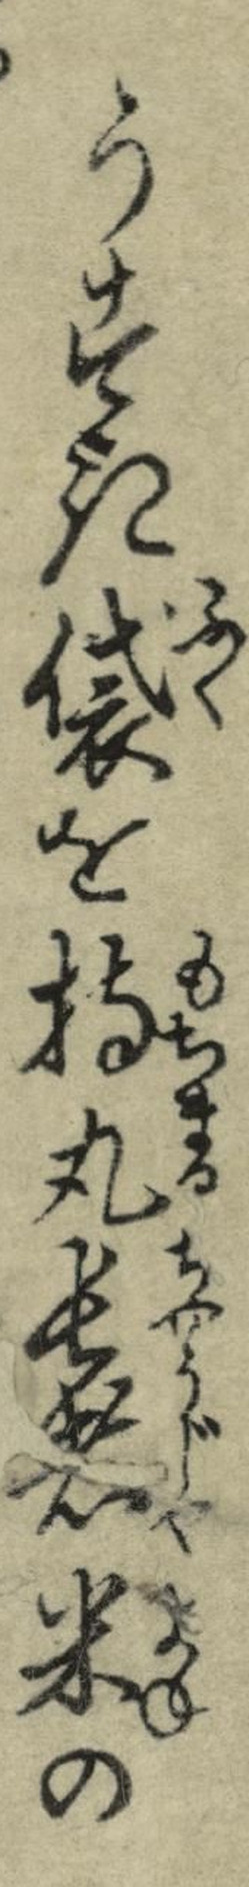うすき袋を持丸長者米の
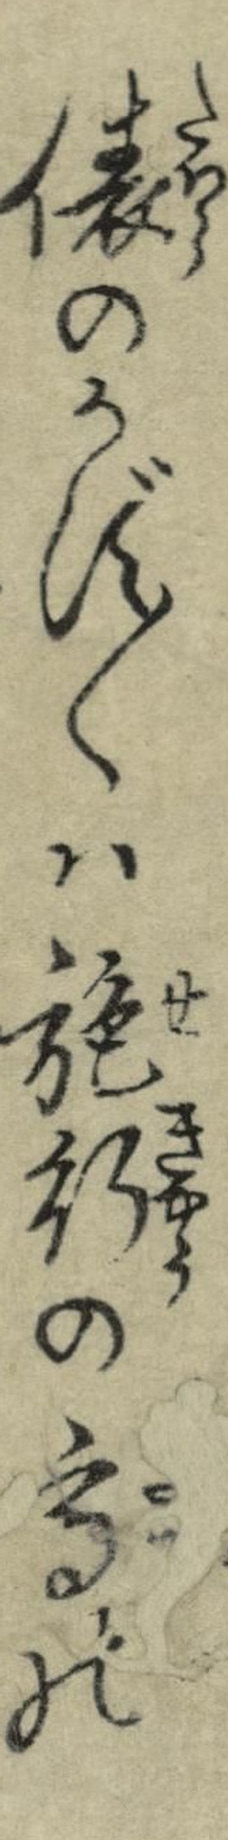俵のかず〳〵は施行の高の
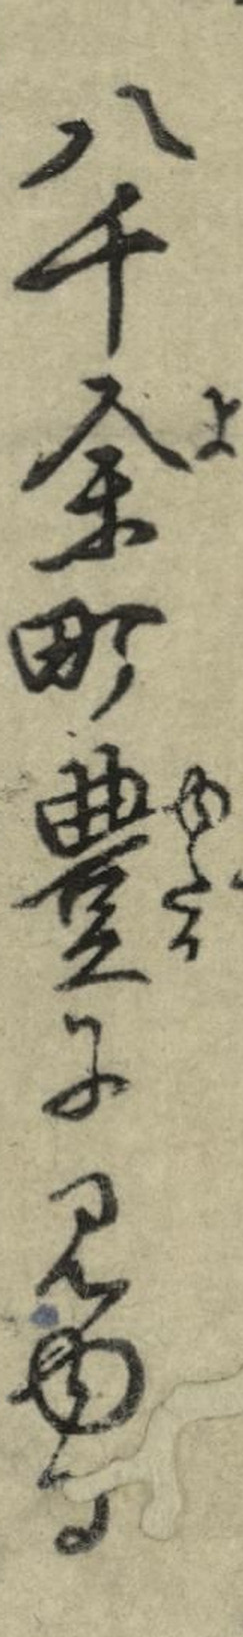八千余町豊に見ゆる
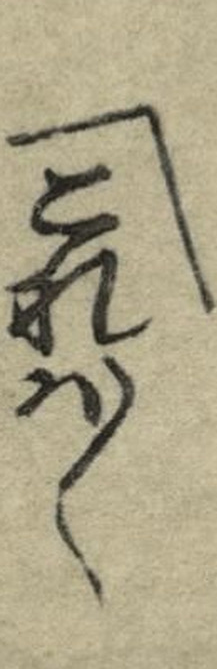〽これは〳〵
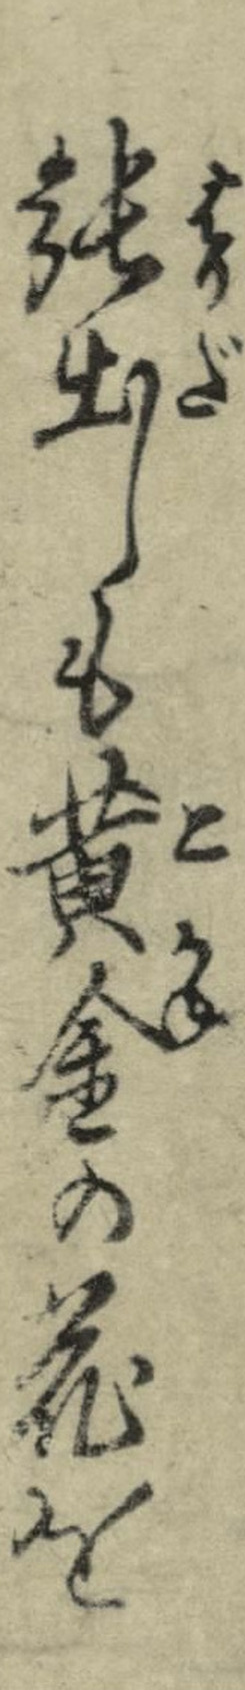張出しも黄金の花を
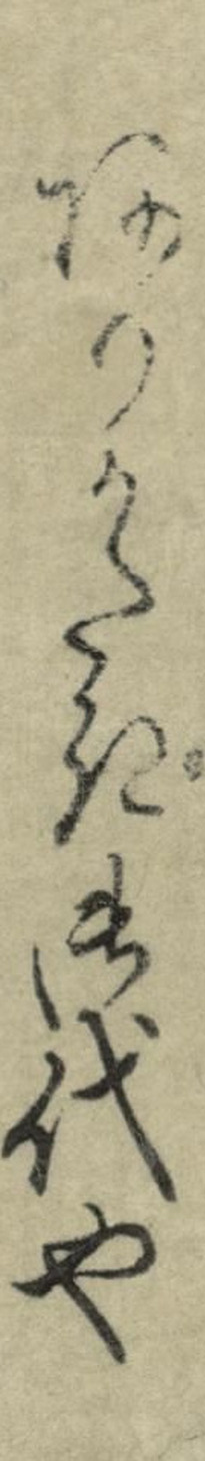ありかたき御代や
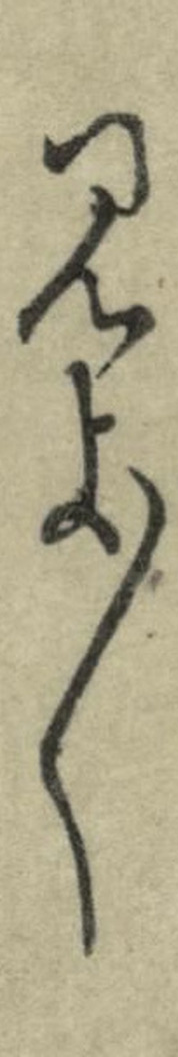見よ〳〵
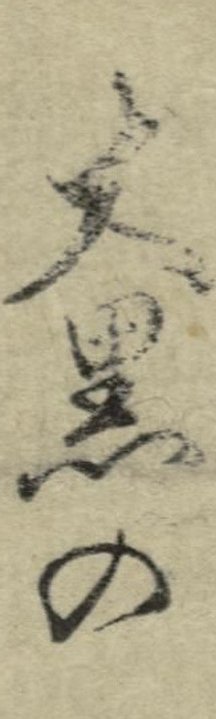大黒の
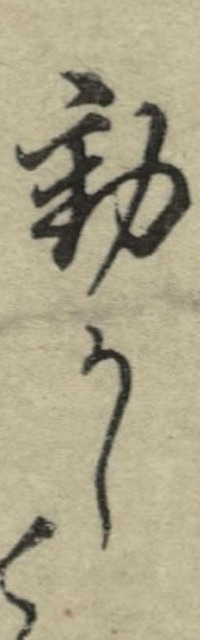動かして
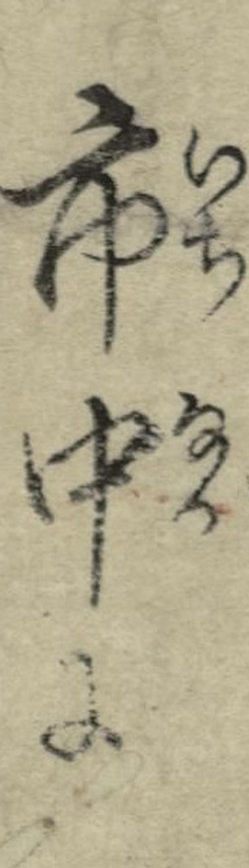市中に
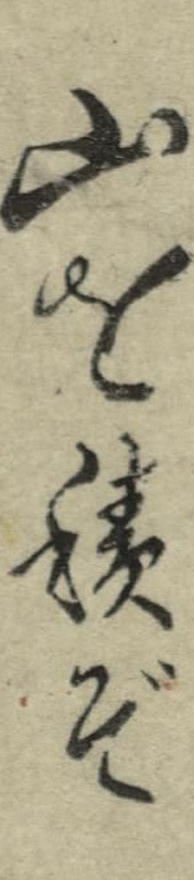山を積ぞ
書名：[大黒のつち]
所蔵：東京大学地震研究所図書室 Earthquake Research Institute Library, The University of Tokyo, JAPAN
